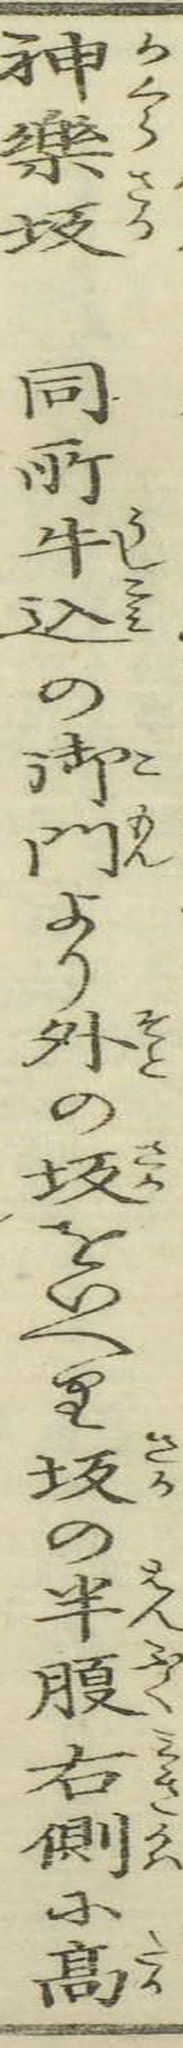神楽坂同所牛込の御門より外の坂をいへり坂の半腹右側に高
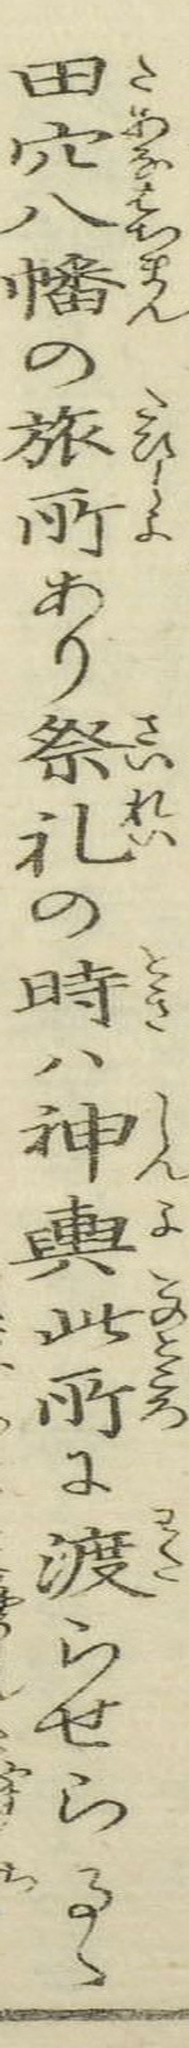田穴八幡の旅所あり祭礼の時は神輿此所に渡らせらるゝ
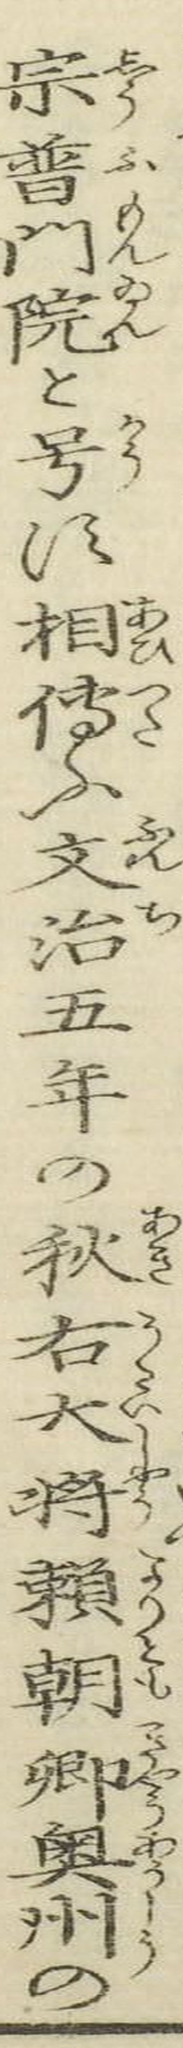宗普門院と号す相伝ふ文治五年の秋右大将頼朝卿奥州の
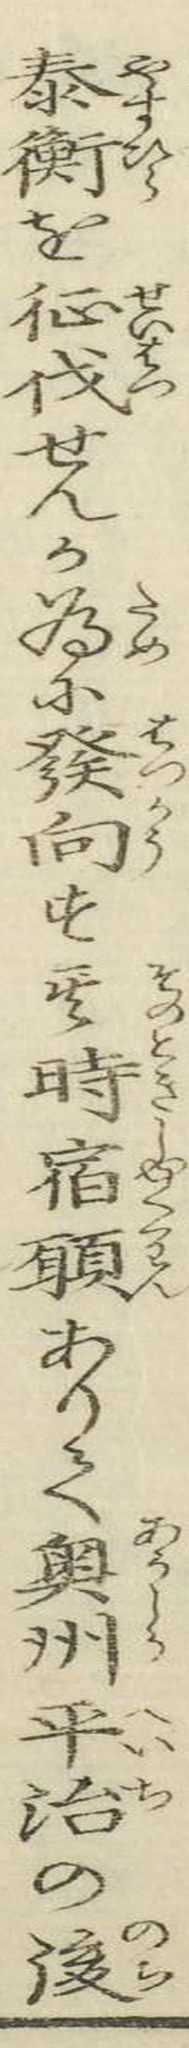泰衡を征伐せんか為に発向す其時宿願ありて奥州平治の後
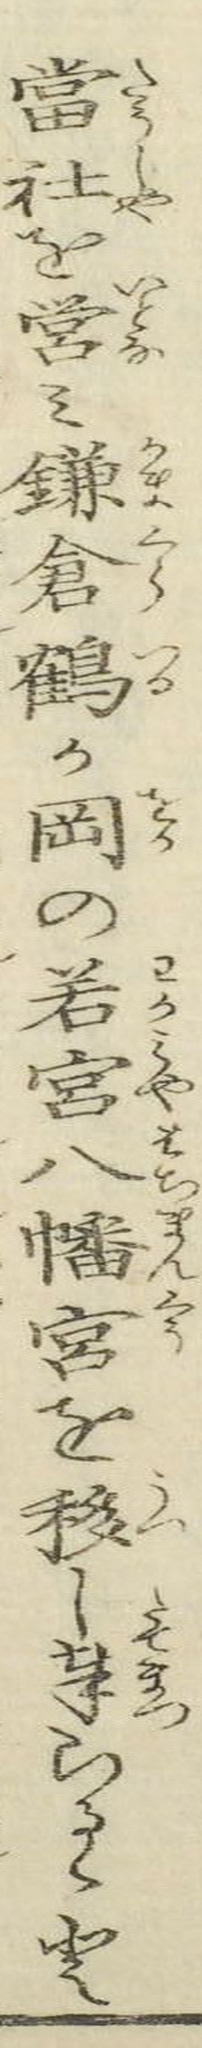当社を営み鎌倉鶴か岡の若宮八幡宮を移し奉らるゝと
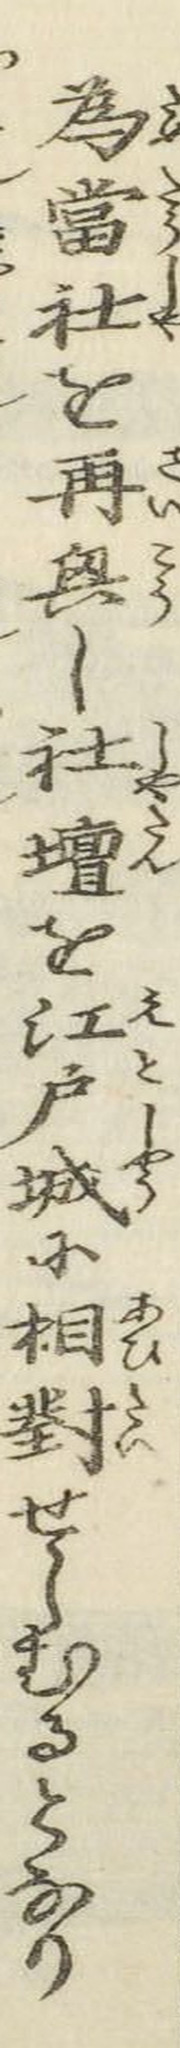為当社を再興し社壇を江戸城に相対せしむるとなり
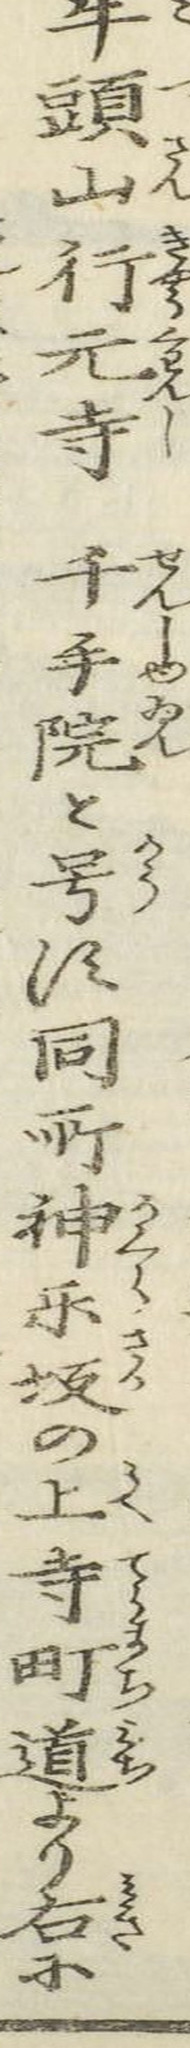牛頭山行元寺千手院と号す同所神楽坂の上寺町道より右に
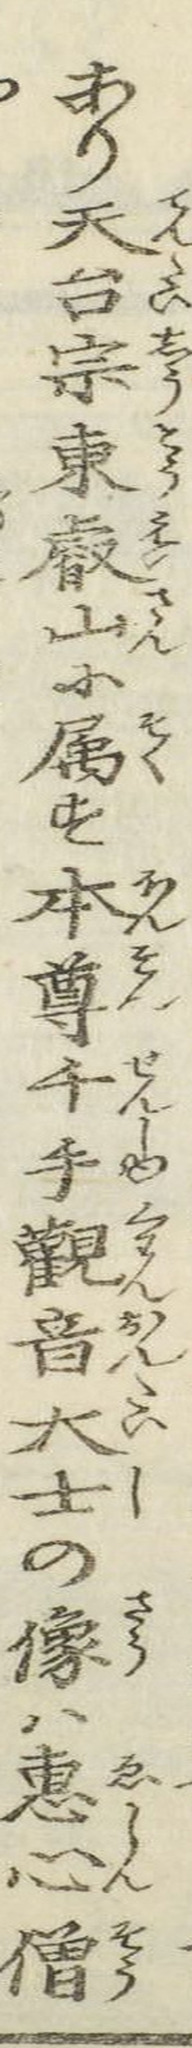あり天台宗東叡山に属す本尊千手観音大士の像は恵信僧
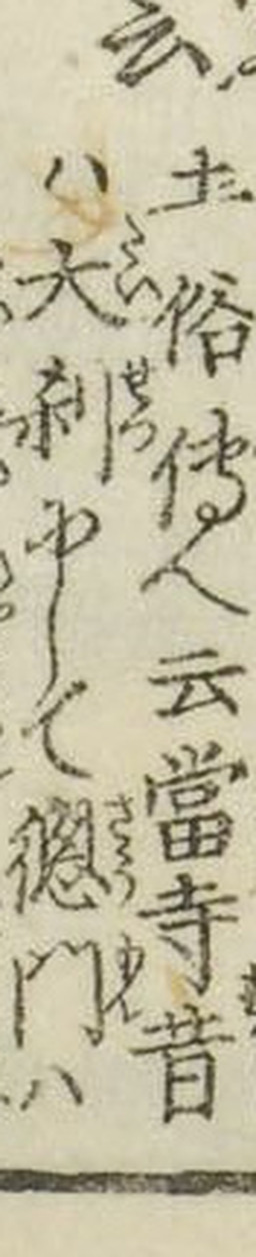は大刹にして総門は
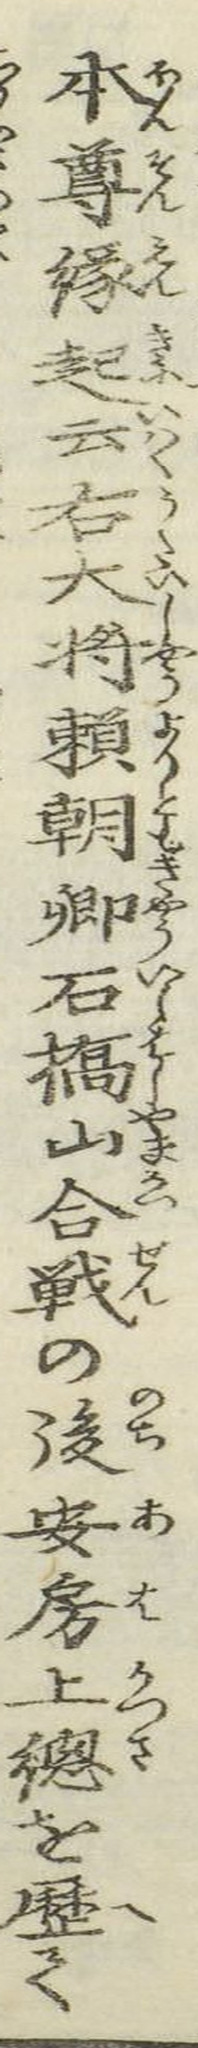本尊縁起云右大将頼朝卿石橋山合戦の後安房上総を歴て
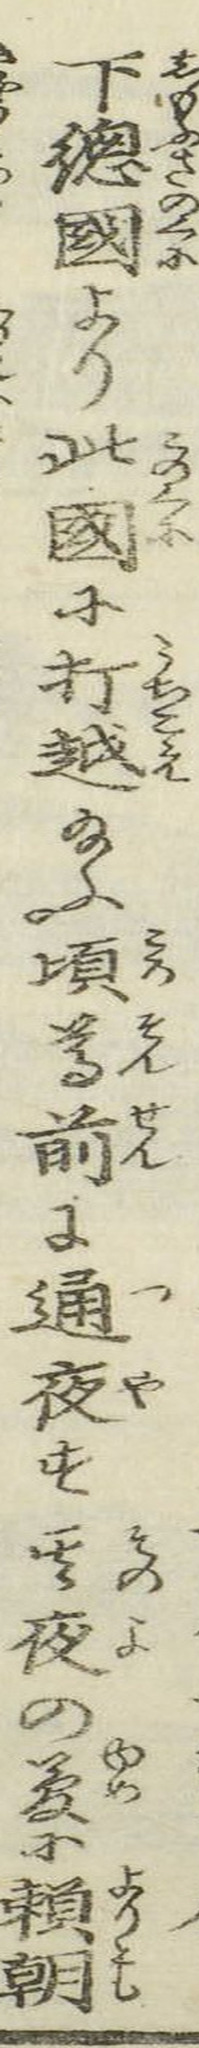下総国より此国に打越給ふ頃尊前に通夜す其夜の夢に頼朝
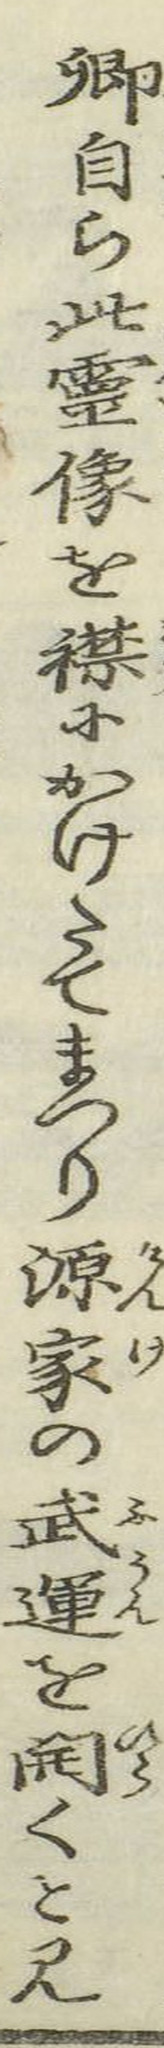卿自ら此霊像を襟にかけたてまつり源家の武運を開くと見
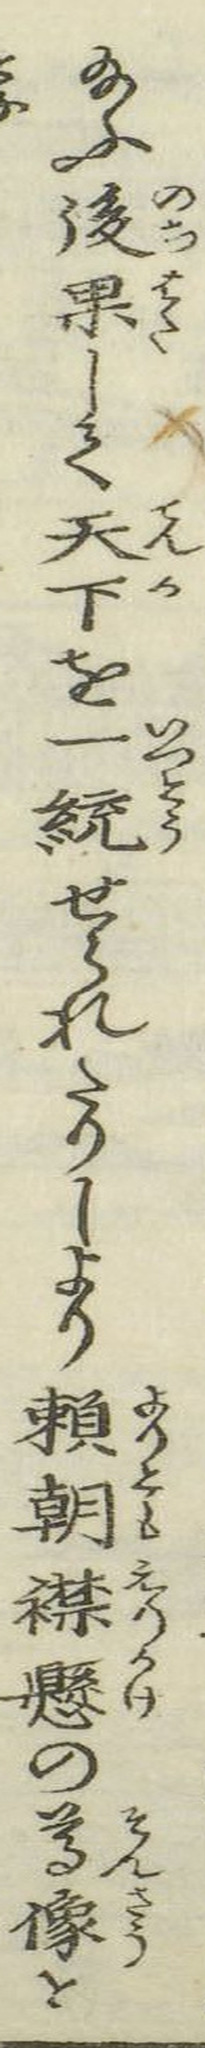給ふ後果して天下を一統せられたりしより頼朝襟懸の尊像を
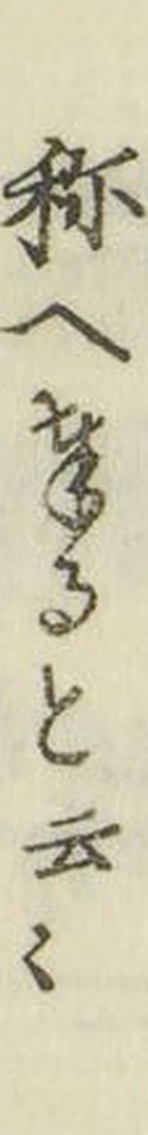称へ奉ると云々
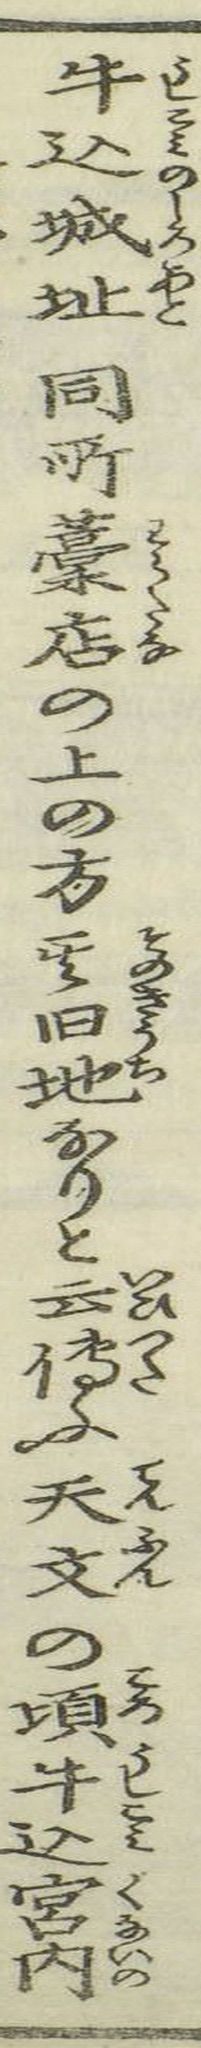牛込城址同所稾店の上の方其旧地なりと云伝ふ天文の頃牛込宮内
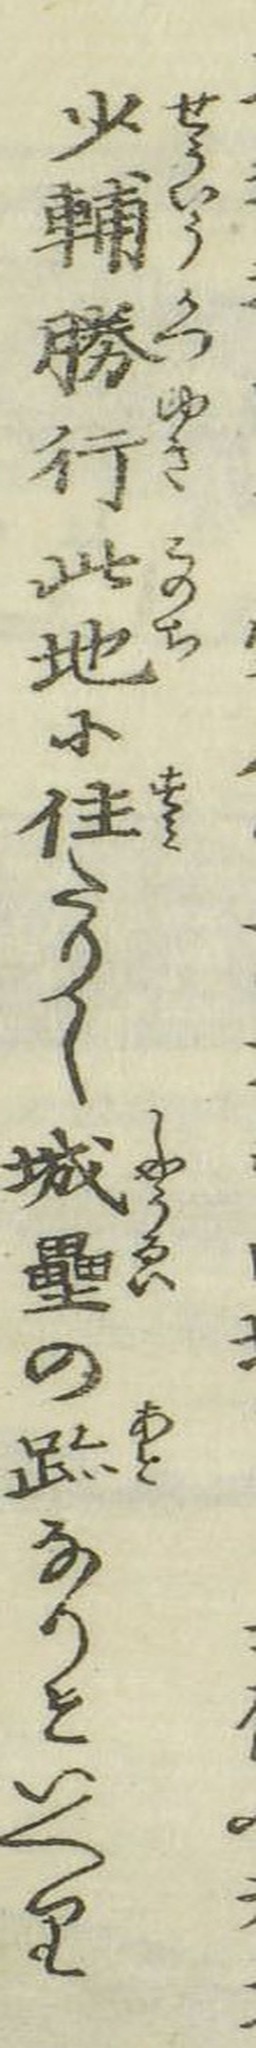少輔勝行此地に住たりし城塁の跡なりといへり
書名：江戸名所図会 20巻 巻之11
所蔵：東京学芸大学教育コンテンツアーカイブ
